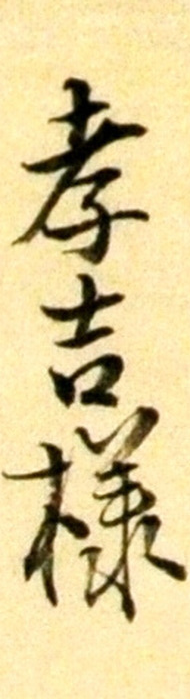孝吉様

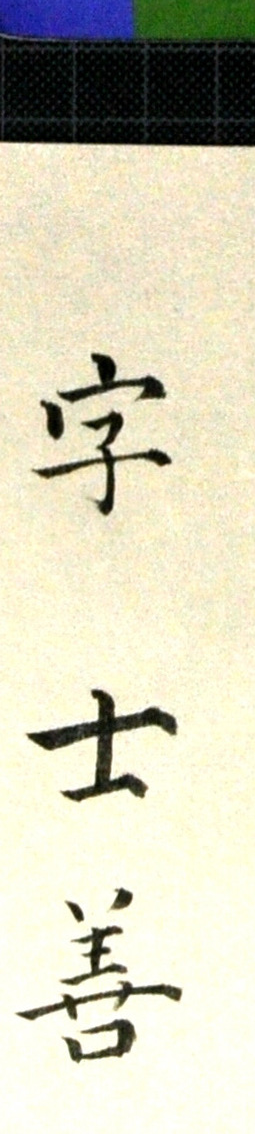字士善
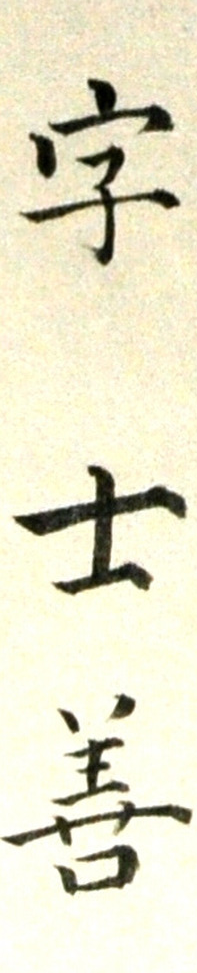字士善
